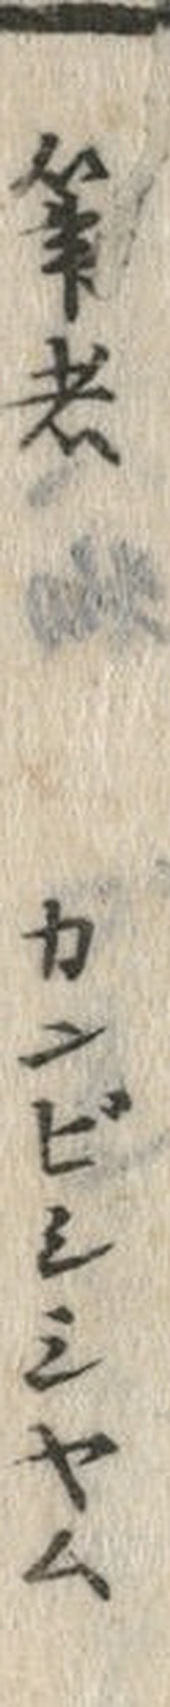筆者カンビシシヤム

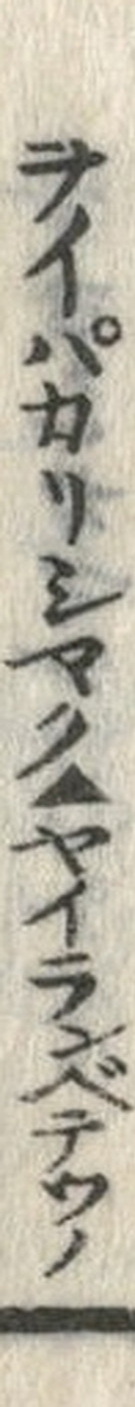幼ヲイパカリシマク▲ヤイランベテウノ

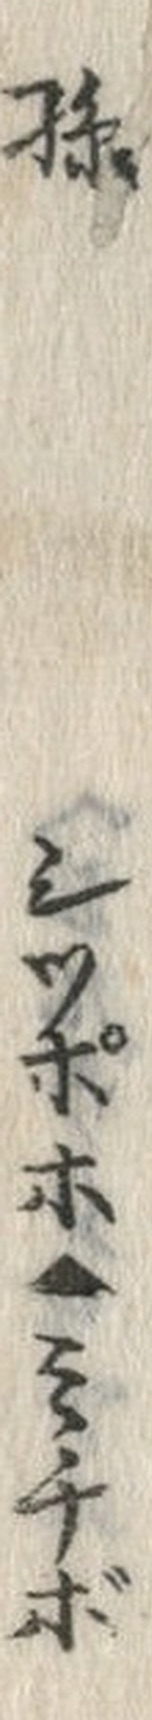孫シツポホ▲ミチボ

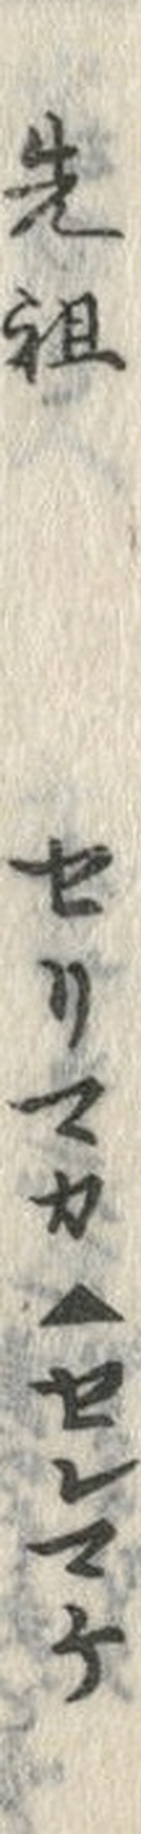先祖セリマカ▲セレマケ

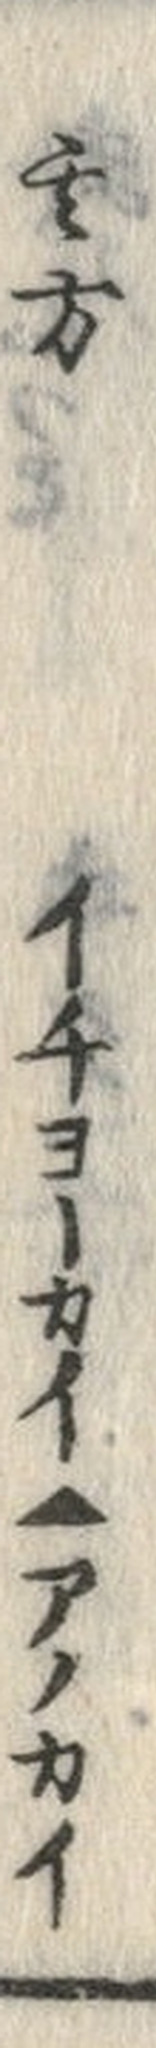其方イチヨーカイ▲アノカイ
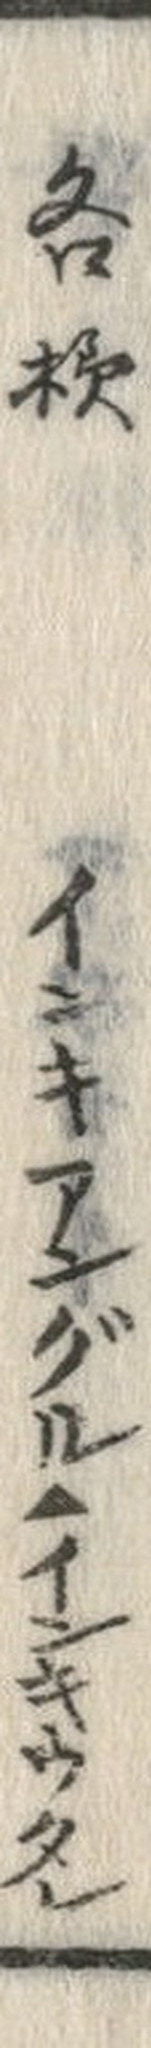各様インキアングル▲インキウタレ
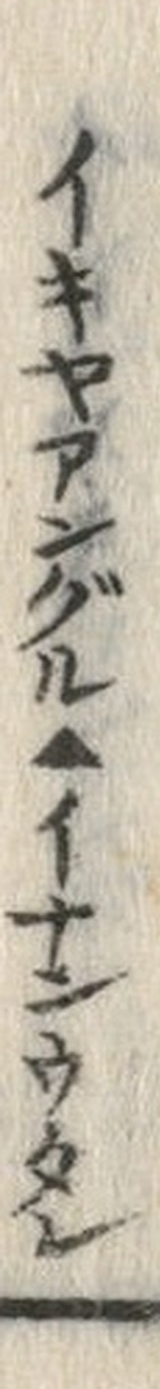イキヤアングル▲イナンウタレ

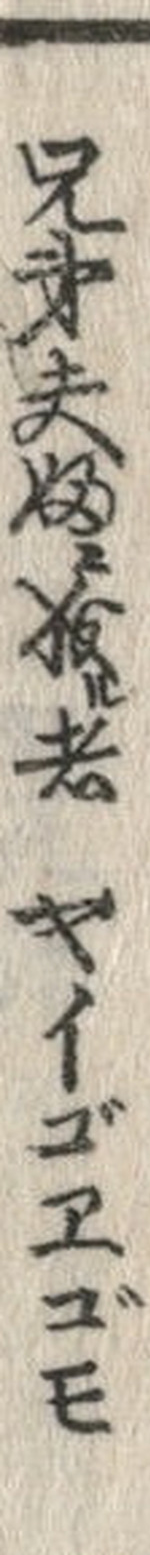兄弟夫婦に成る者ヤイゴヱゴモ
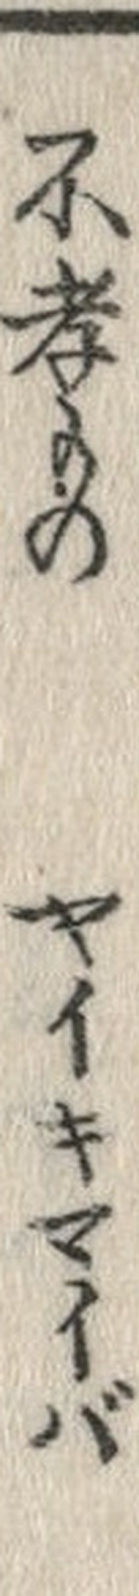不孝ものヤイキマイバ
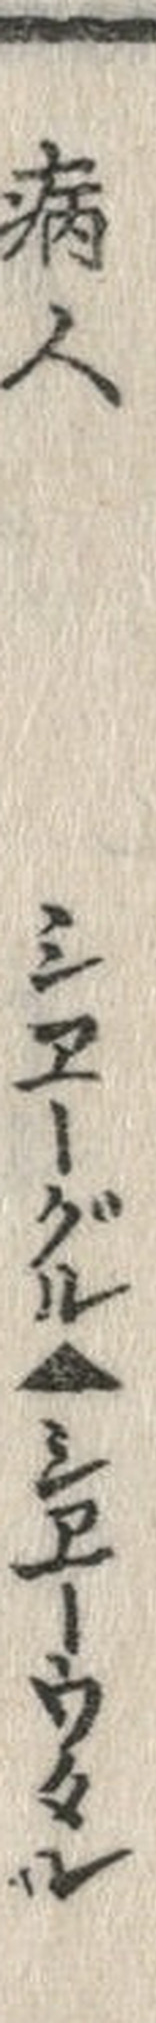病人シヱーグル▲シヱーウタレ
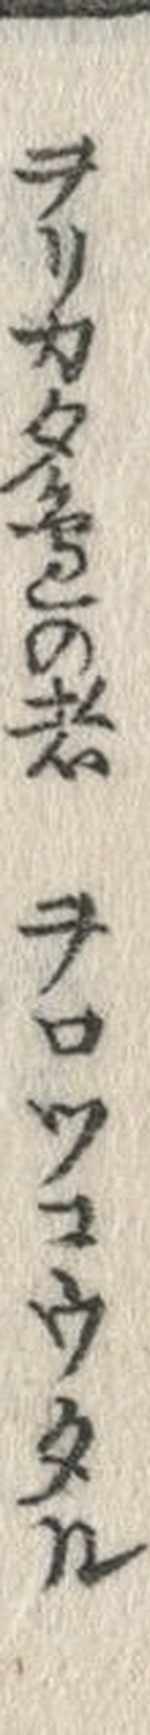ヲリカタ辺の者ヲロツコウタル
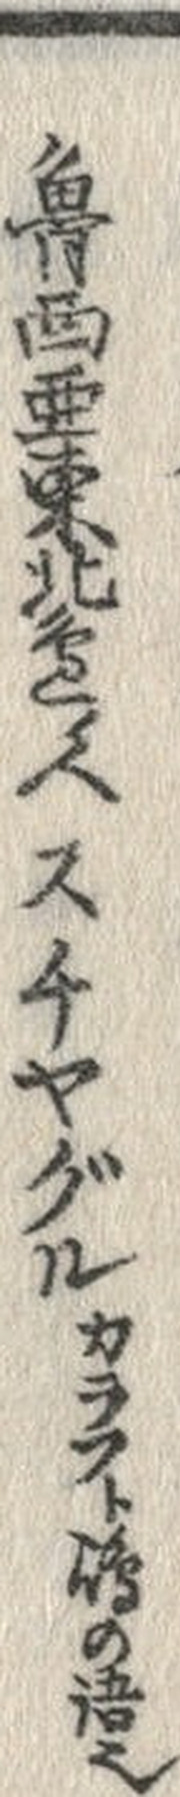露西亜東北辺の人スチヤグルカラフト島の語也
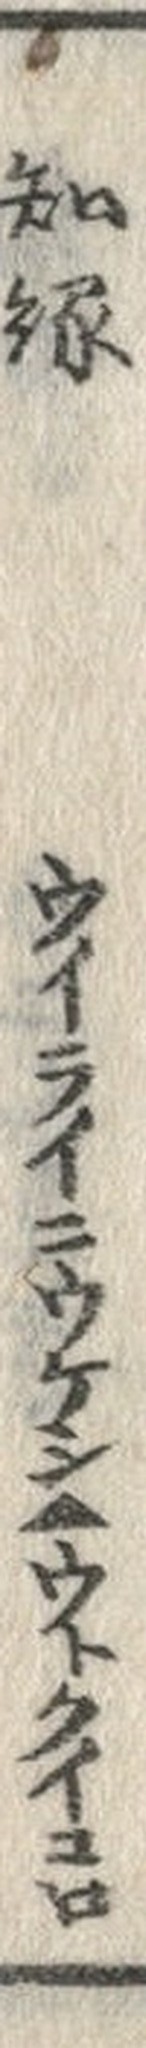知縁ウイライニウケシ▲ウトクイコロ

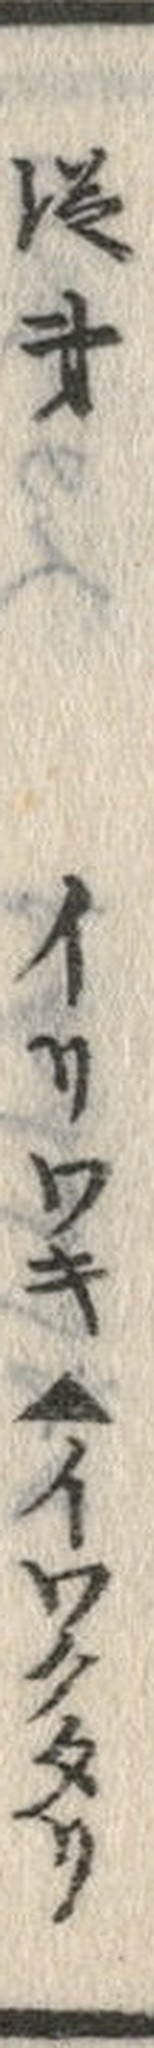従弟イリワキ▲イワクタリ

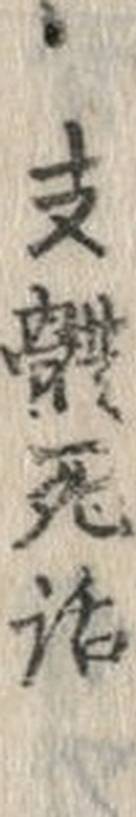支体死活

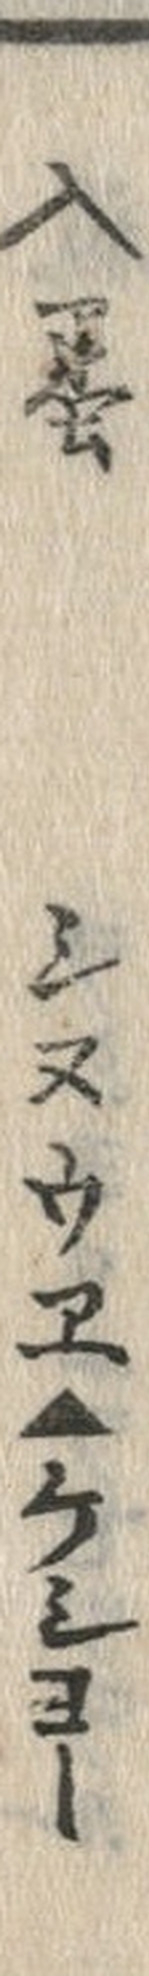入墨シヌウヱ▲ケシヨー
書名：蝦夷方言藻汐草　乾巻
